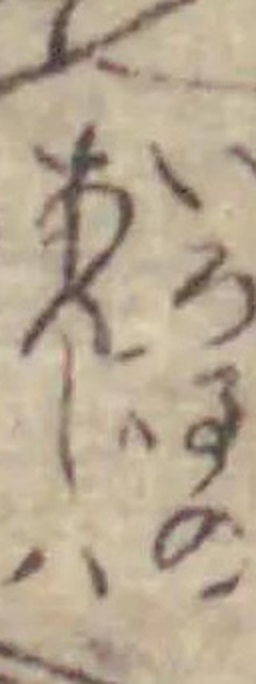あんじは
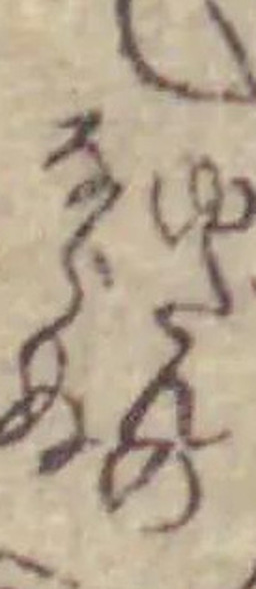ならぬ
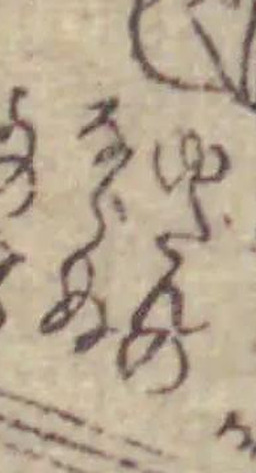ならぬ
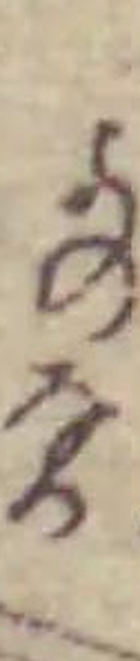よのなか
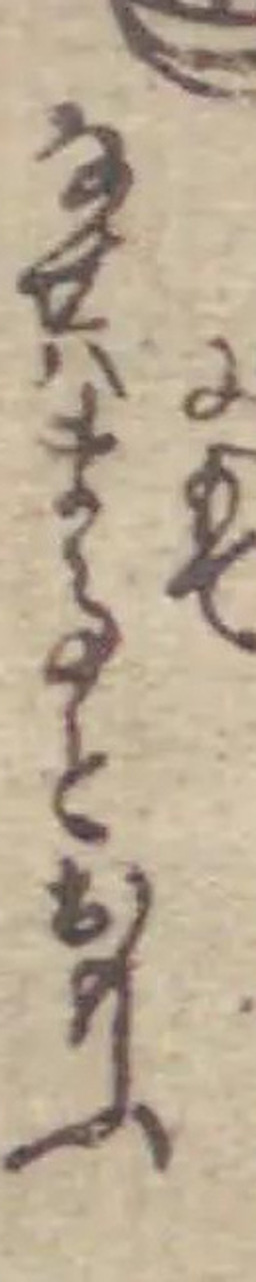なせはま事とおもふ

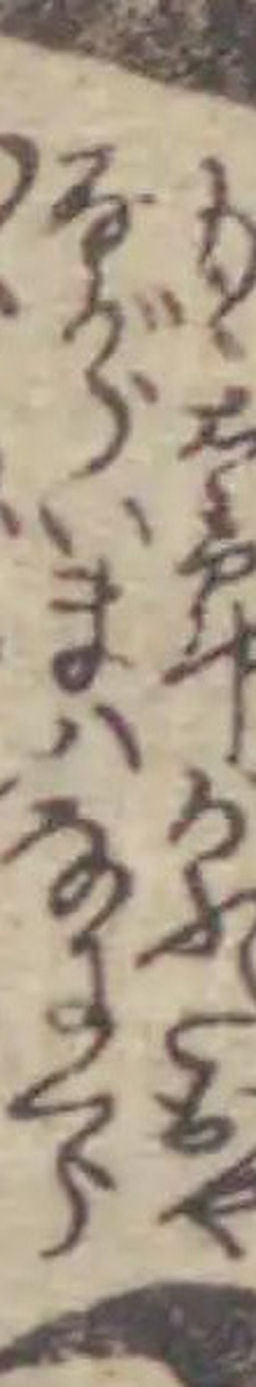ながらいまはなにくら
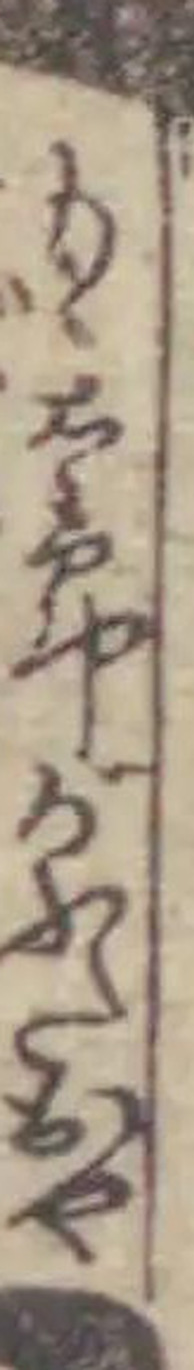もゝ太郎申がふたおや
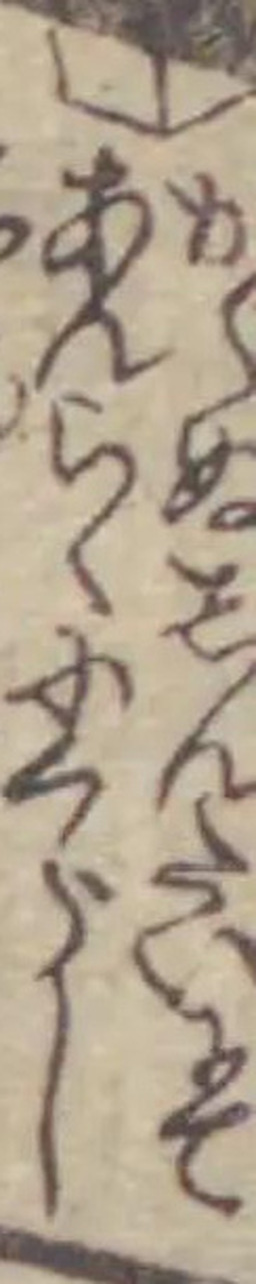あんらくにくらし
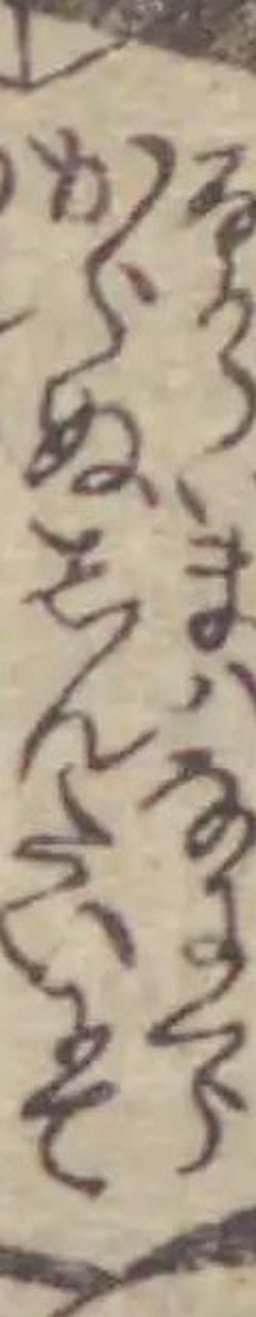からぬしんたいにて
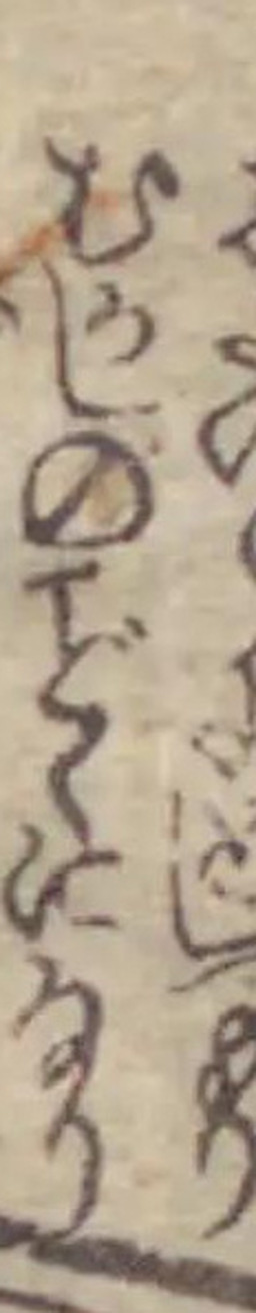むかしのごとくになり
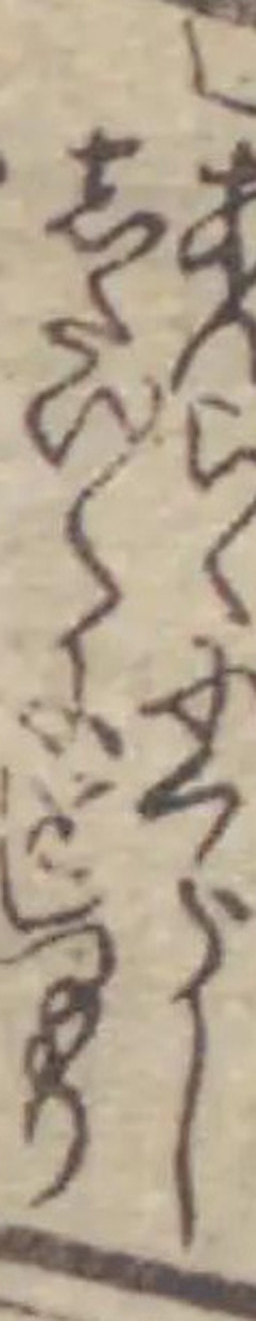したい〳〵にとしつもり
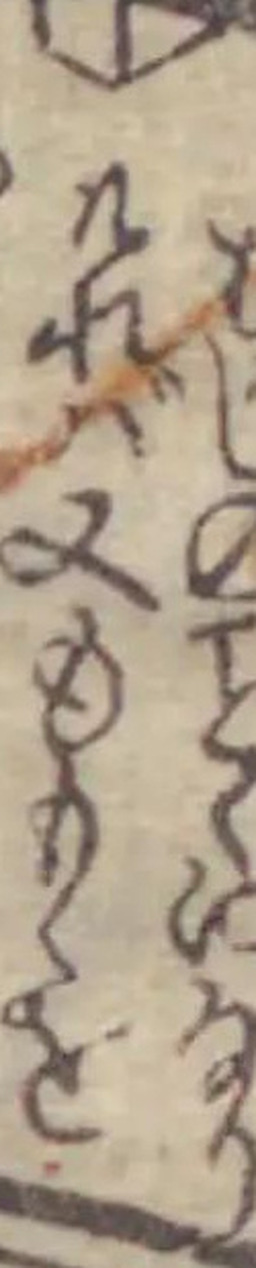ければ又ももゝを
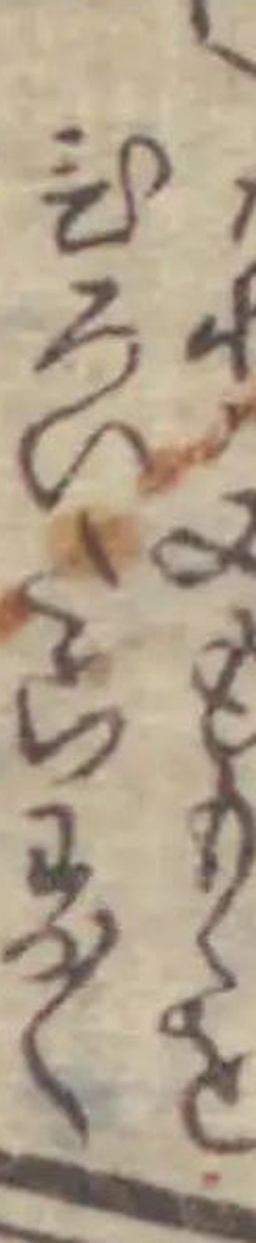ひろいたらわかく
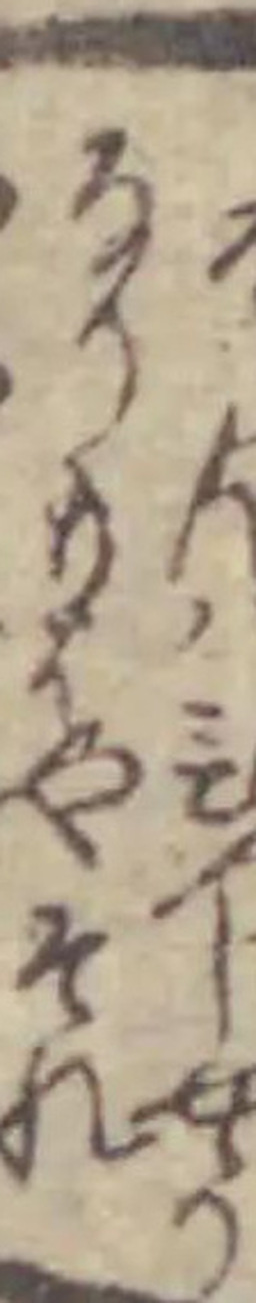なりもはやそれ
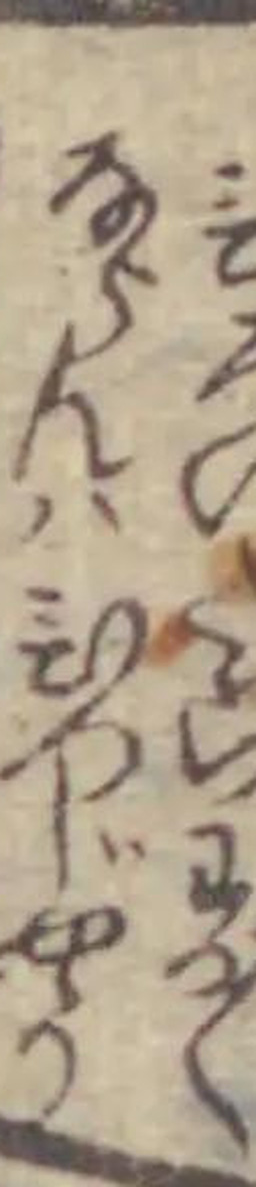ならんはひつじやう
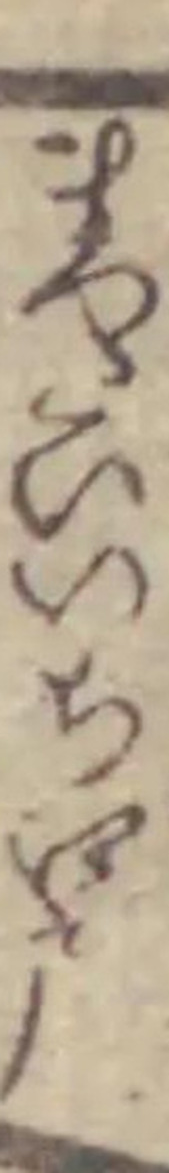まつたいいち江戸
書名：桃太郎元服姿 2巻
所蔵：国立国会図書館 National Diet Library, JAPAN
